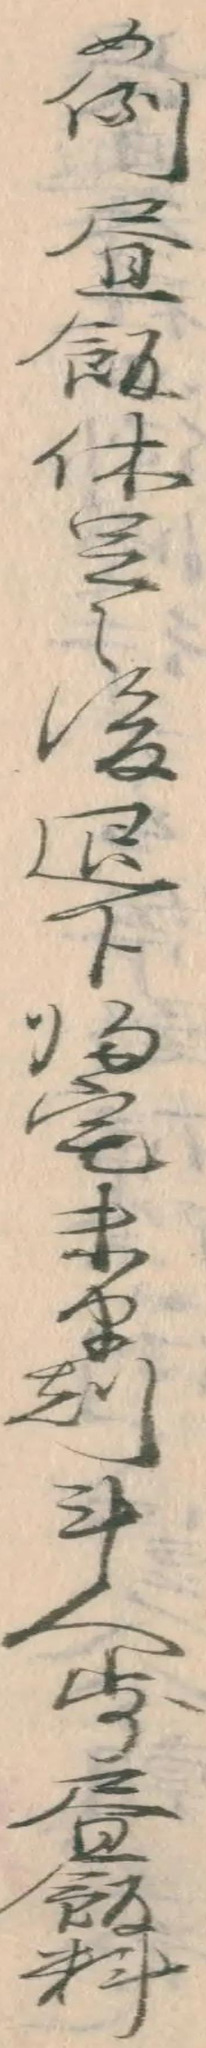如例昼飯休足之後退下帰宅未半刻斗人歩昼飯料
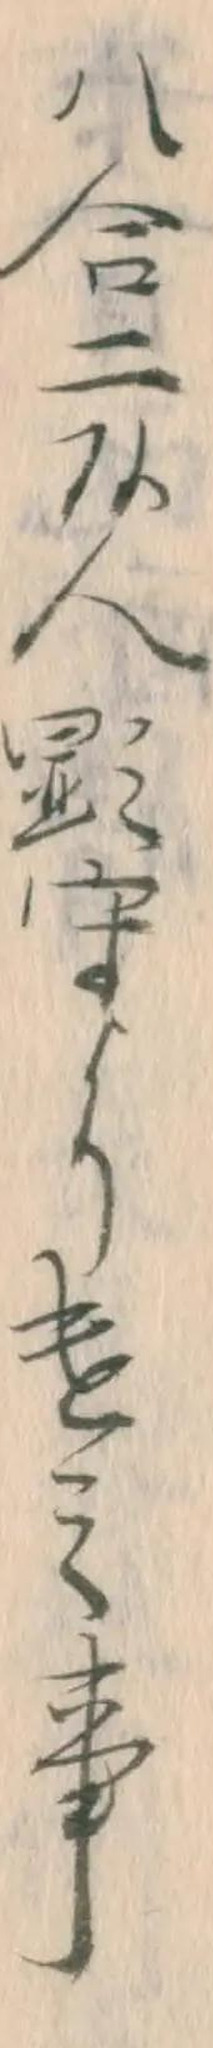八合二頭人顕守より遣之事
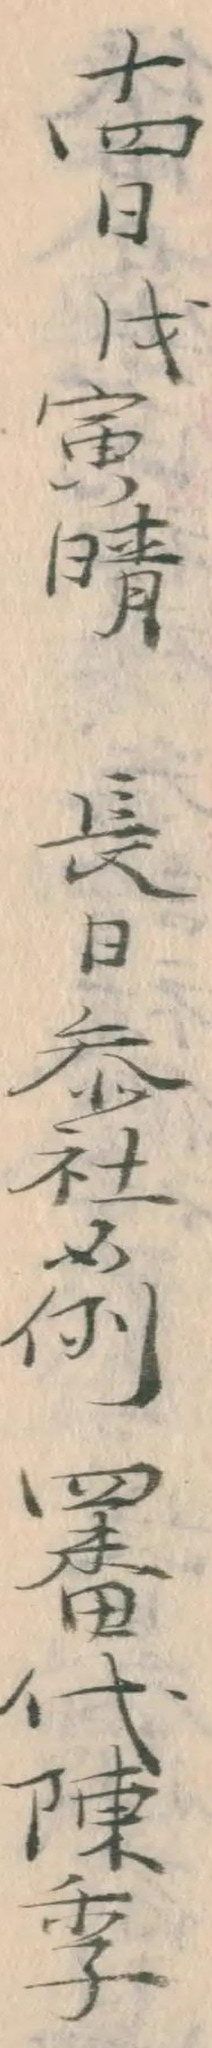十四日戊寅晴長日参社如例四番代陳季
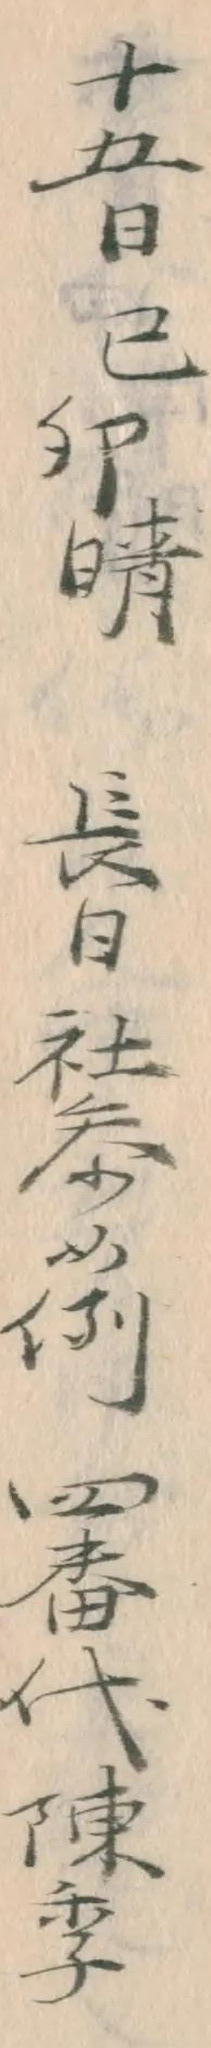十五日己卯晴長日参社如例四番代陳季
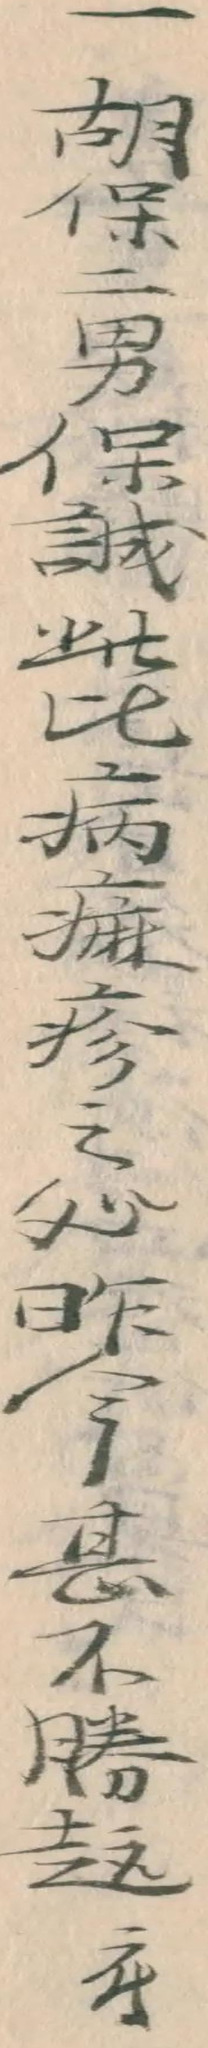一胡保二男保誠此比病麻疹之処昨今甚不勝趣ニ付
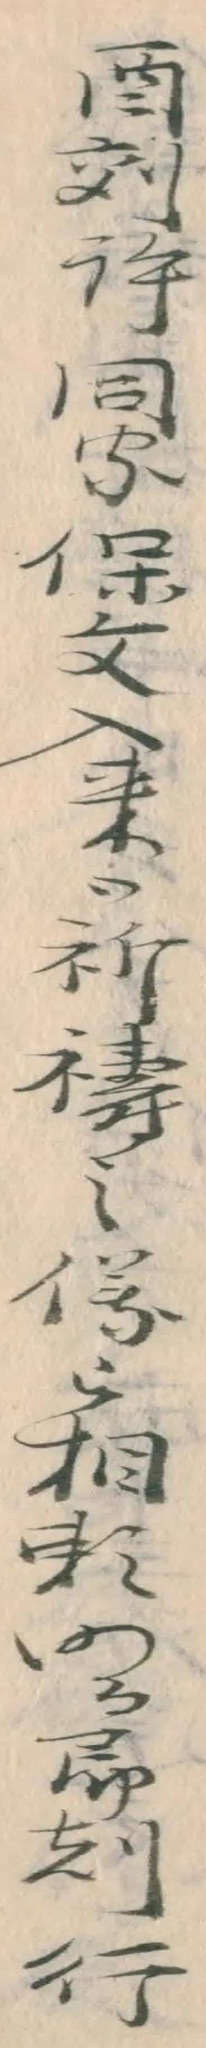酉刻同家保文入来御祈祷之儀被相頼仍而即刻行
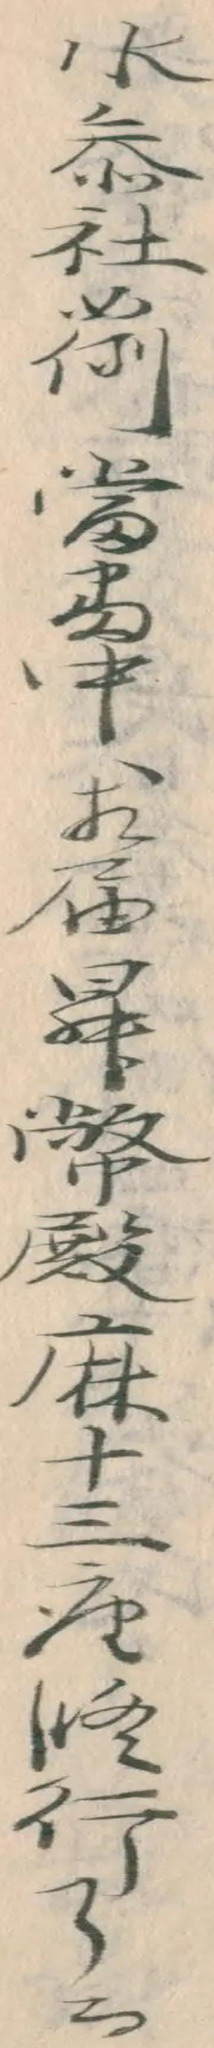水参社如例當番中相届昇幣殿麻十三座修行了而
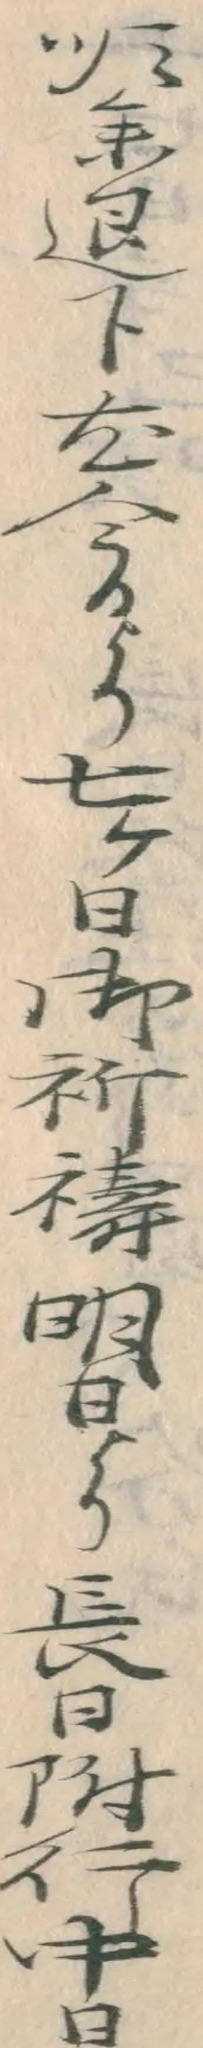順参退下尤今日より七ケ日御祈祷明日より長日附行中日
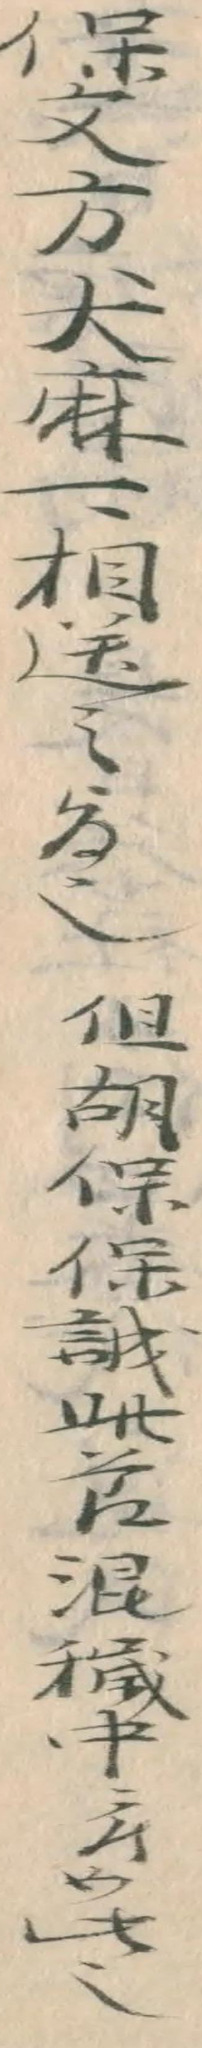保文方へ大麻可相送之旨也但胡保保誠此節混穢中ニ付如此也

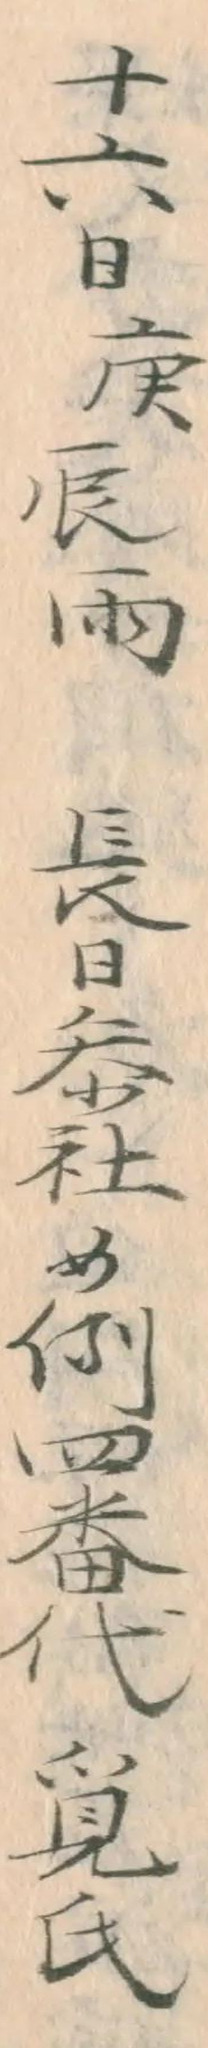十六日庚辰雨長日参社如例四番代覓氏
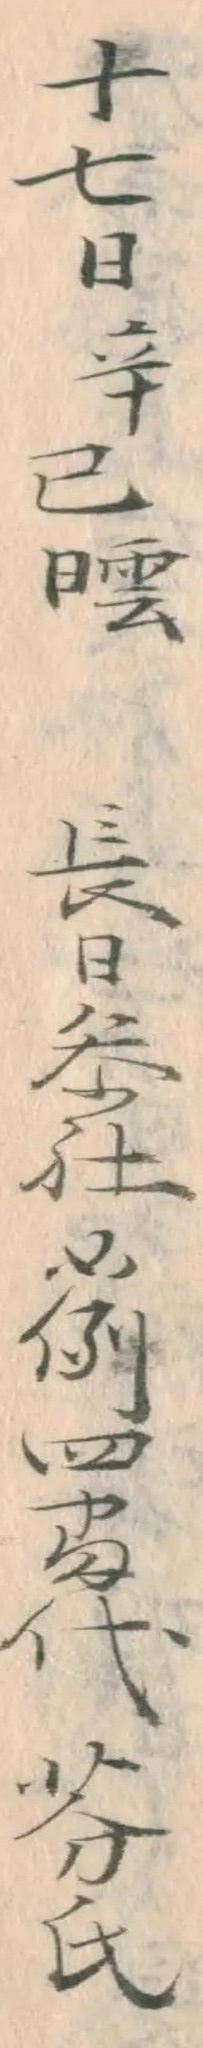十七日辛巳曇長日参社如例四番代覓氏
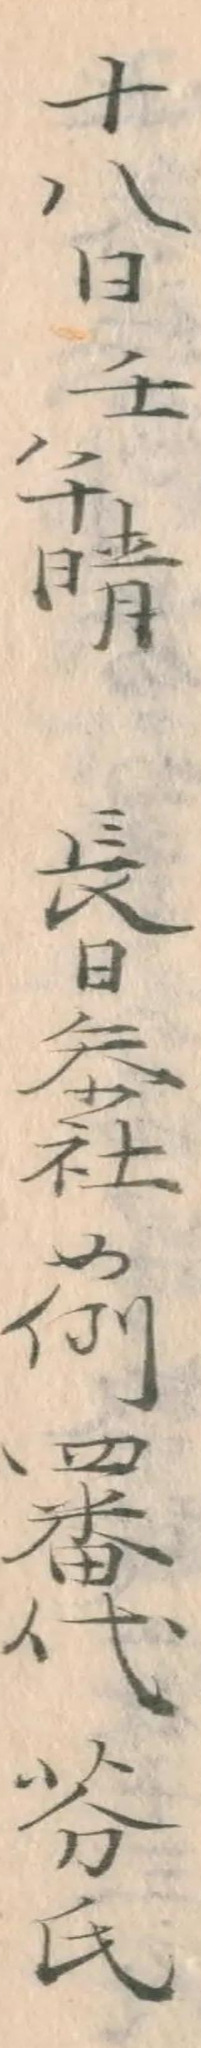十八日壬午晴長日参社如例四番代覓氏
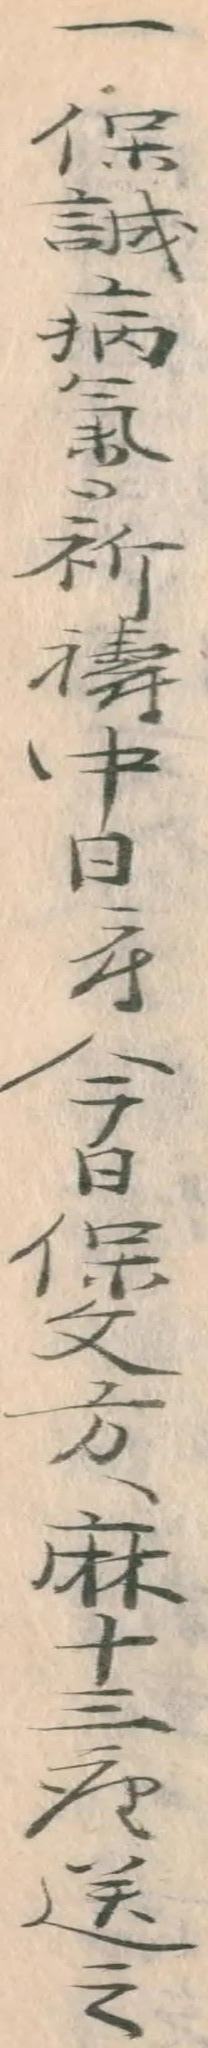一保誠病氣御祈祷中日ニ付今日保文方へ麻十三座送之
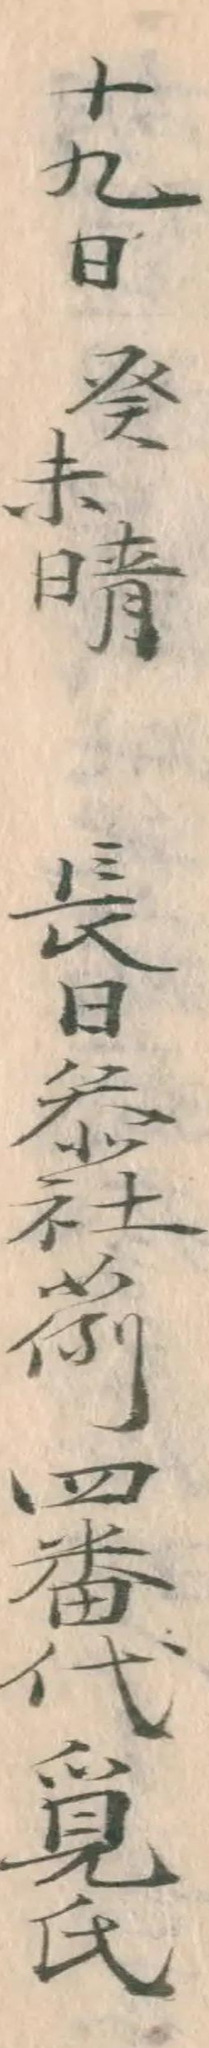十九日癸未晴長日参社如例四番代覓氏
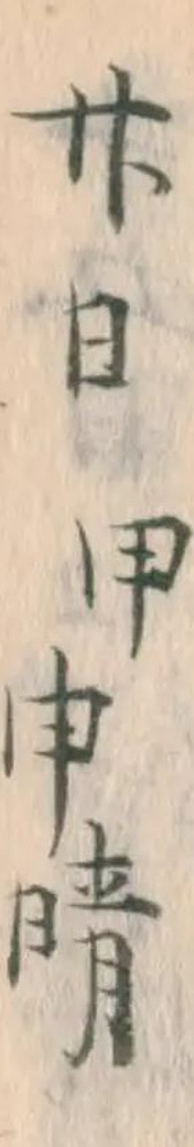廿日甲申晴
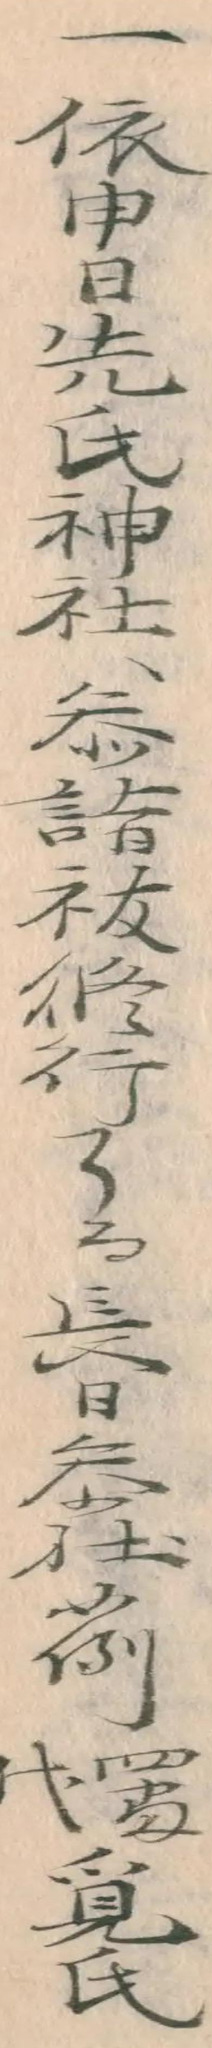一依申日先氏神社へ参詣祓修行了而長日参社如例四番代覓氏
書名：賀茂社記録. 第73冊
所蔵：国立国会図書館 National Diet Library, JAPAN
